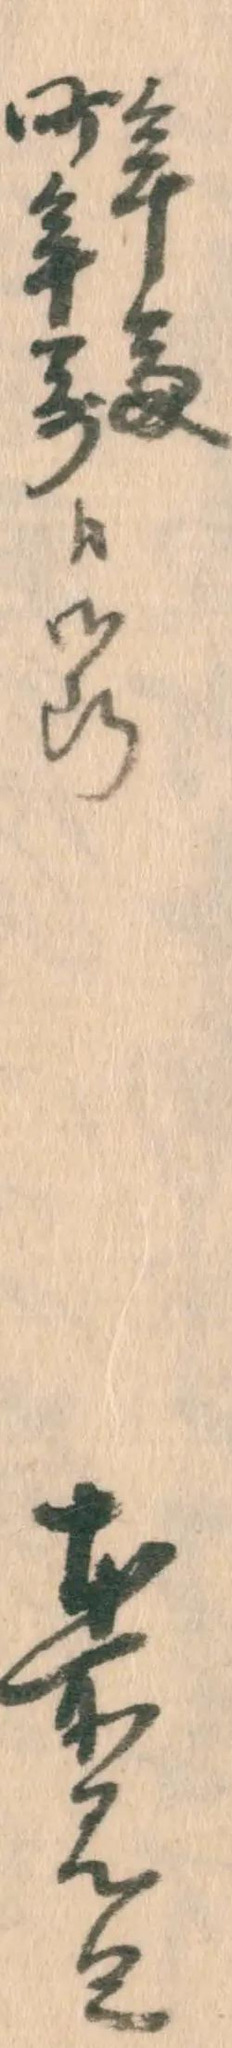町年寄え御断本所見廻
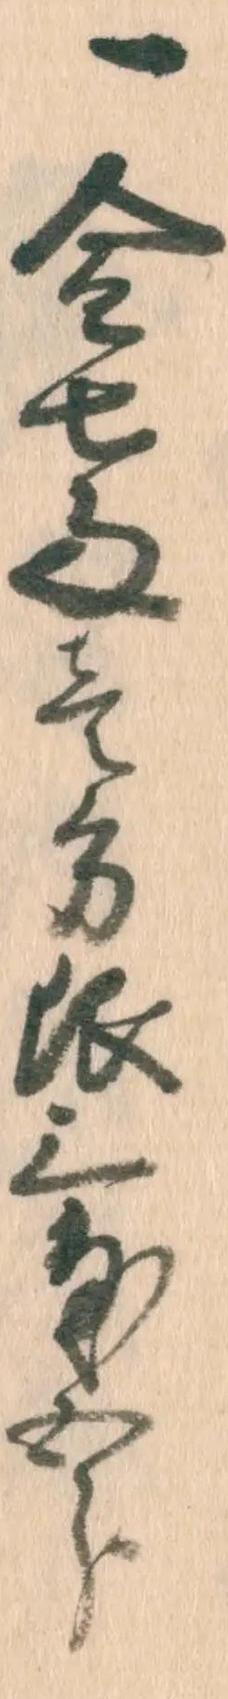一金七両壱分銀三匁五分
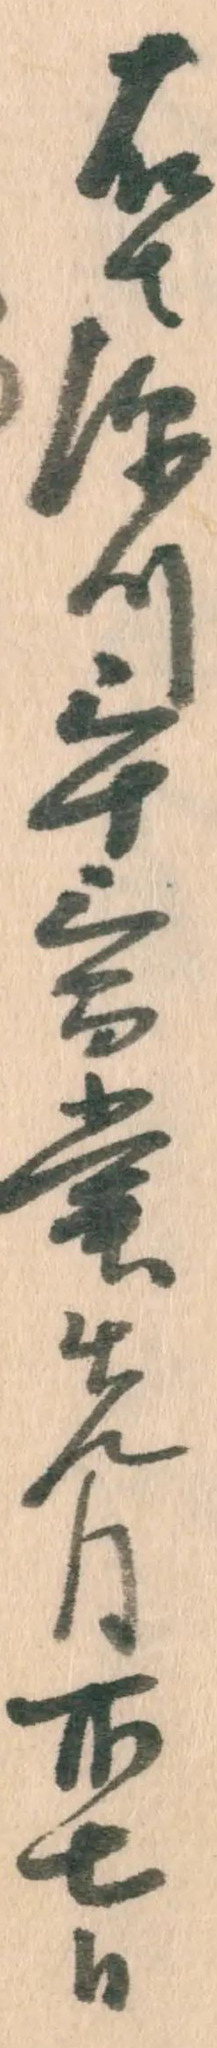右は深川三十三間堂先月廿七日
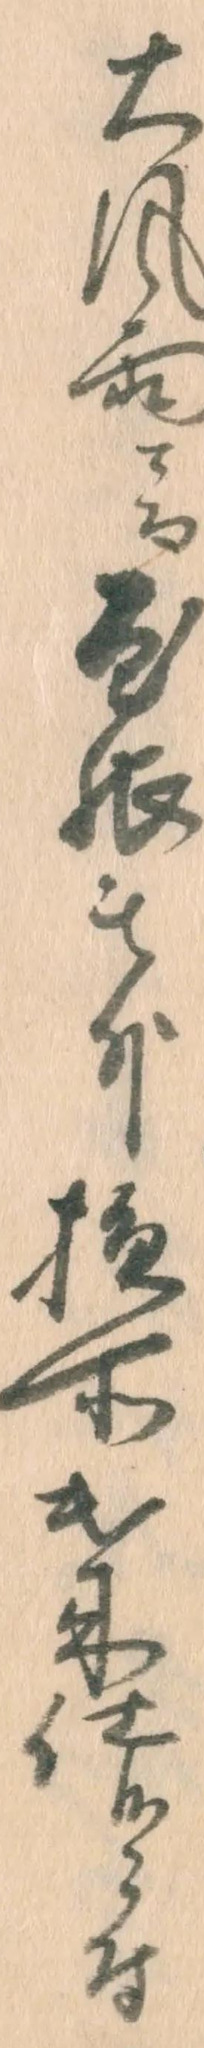大風雨に而屋根其外損所出来仕候に付

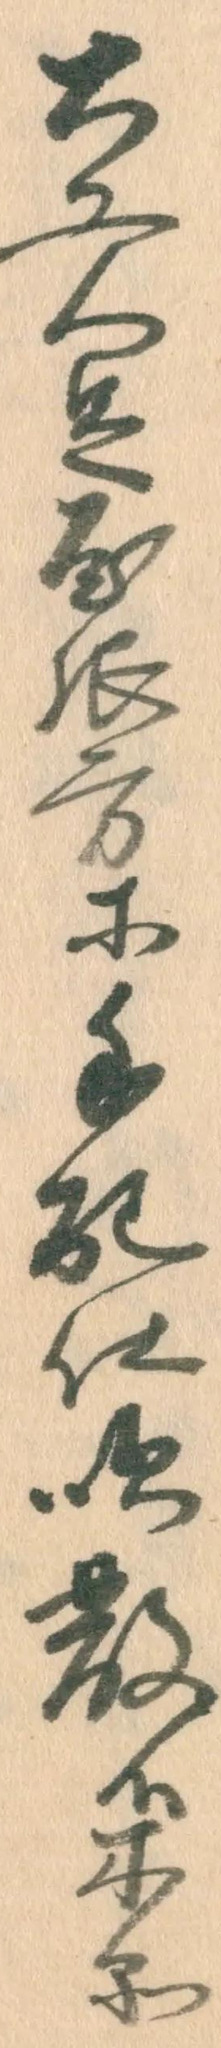大工人足屋根方等手配仕吹散候木品
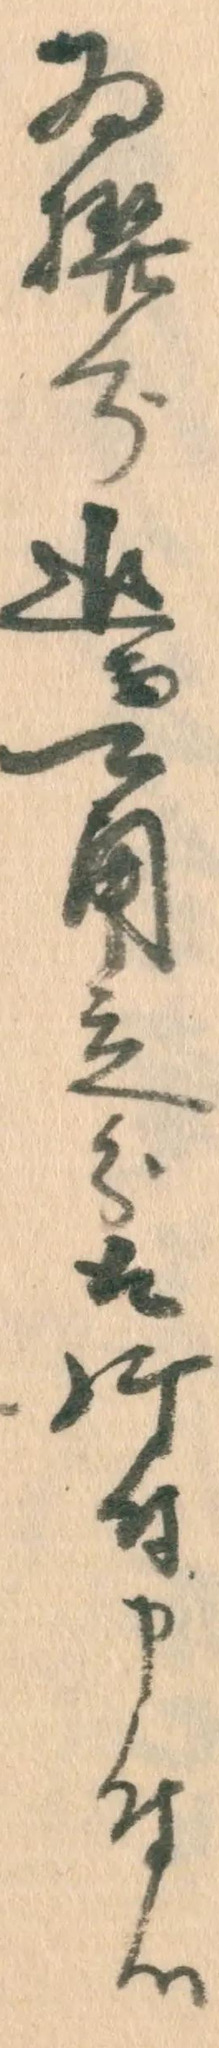為撰分追而可用立分取片付申付候
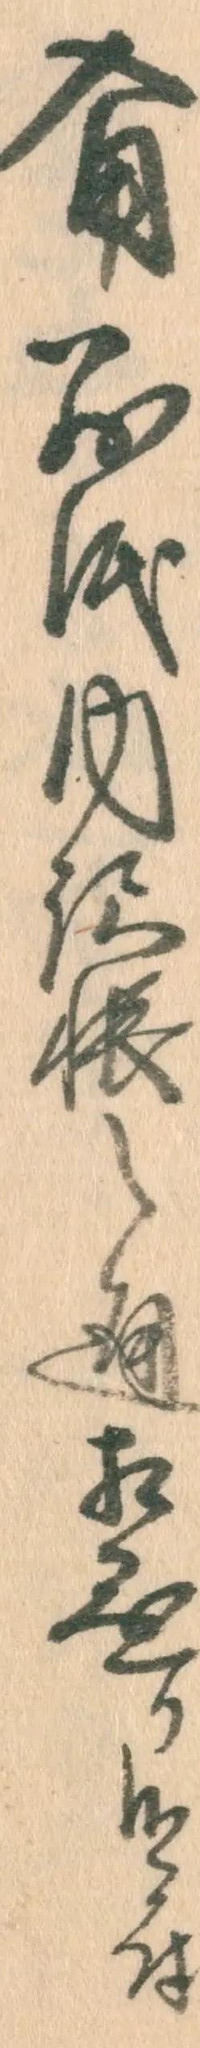入用別紙内訳帳之通相懸り候に付
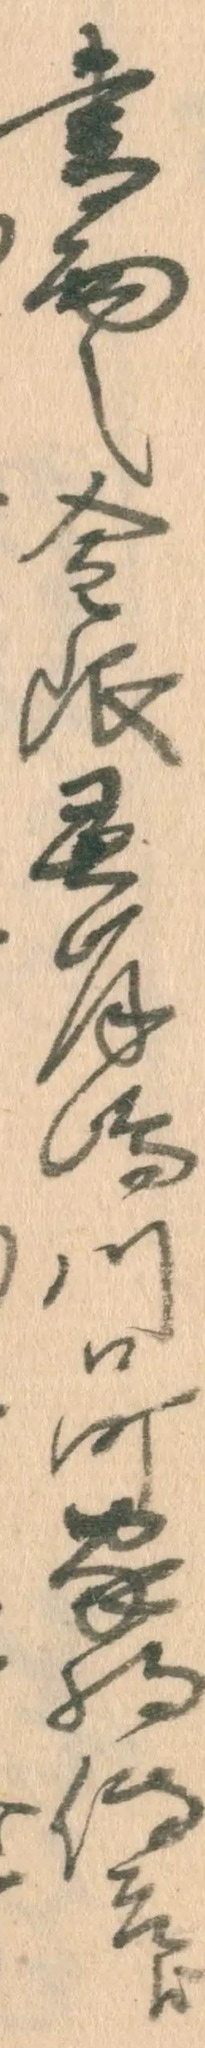書面之金銀霊岸嶋川口町家持伝吉え
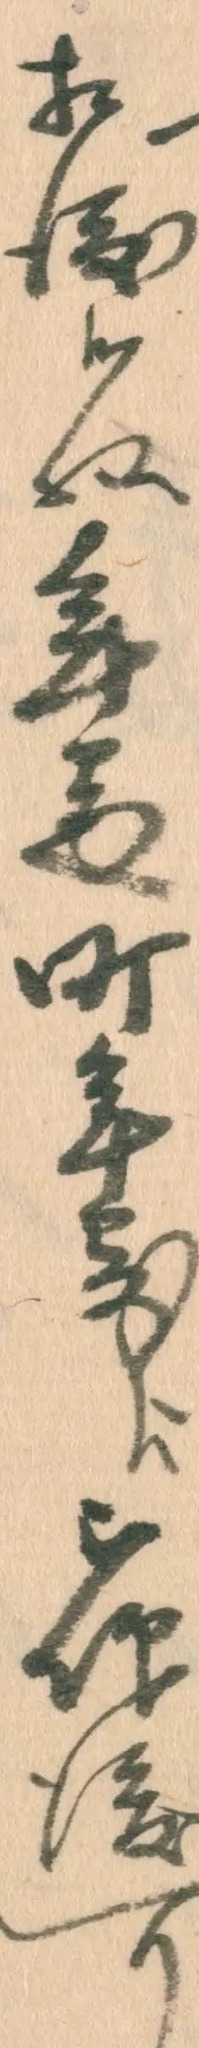相渡候様年寄町年寄え被仰渡可
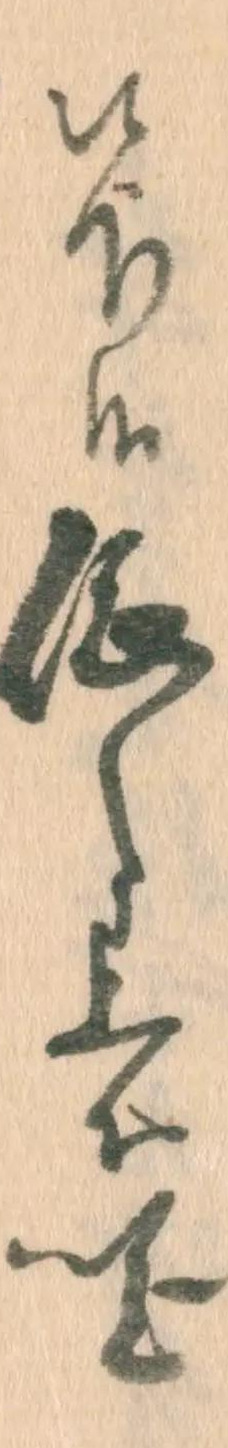被下候依之申上候以上
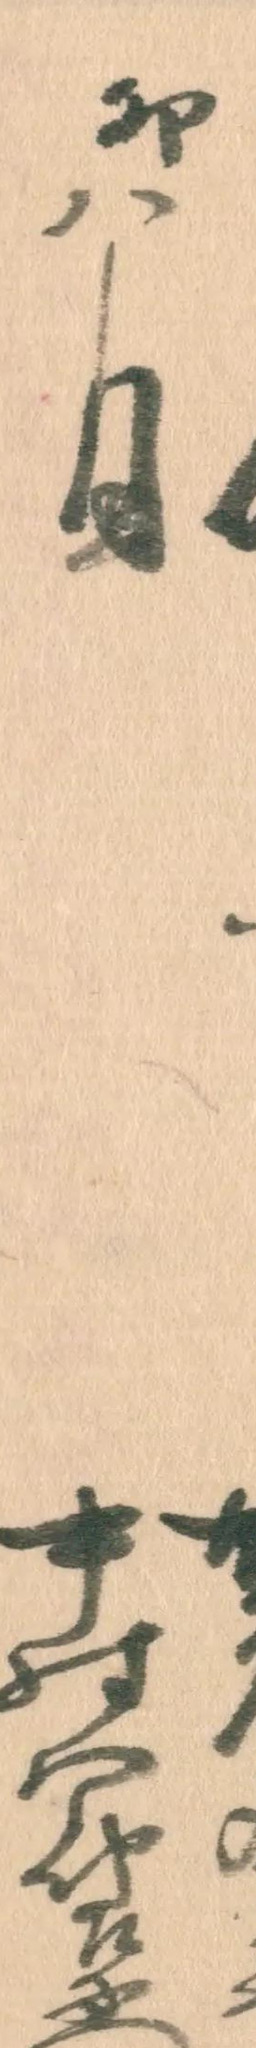卯八月加藤又左衛門
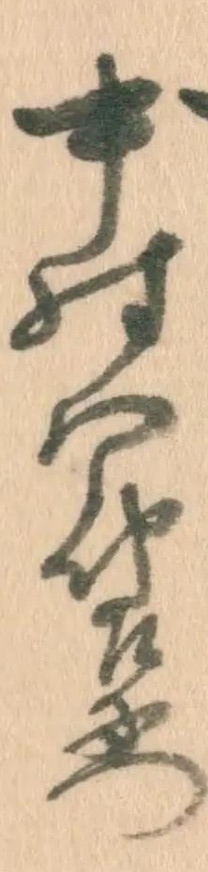中村八郎左衛門
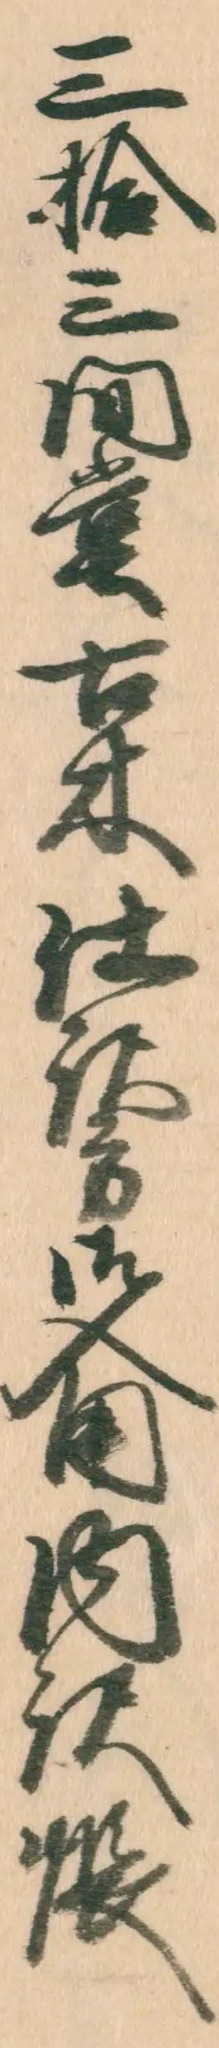三十三間堂古木仕訳方御入用内訳帳

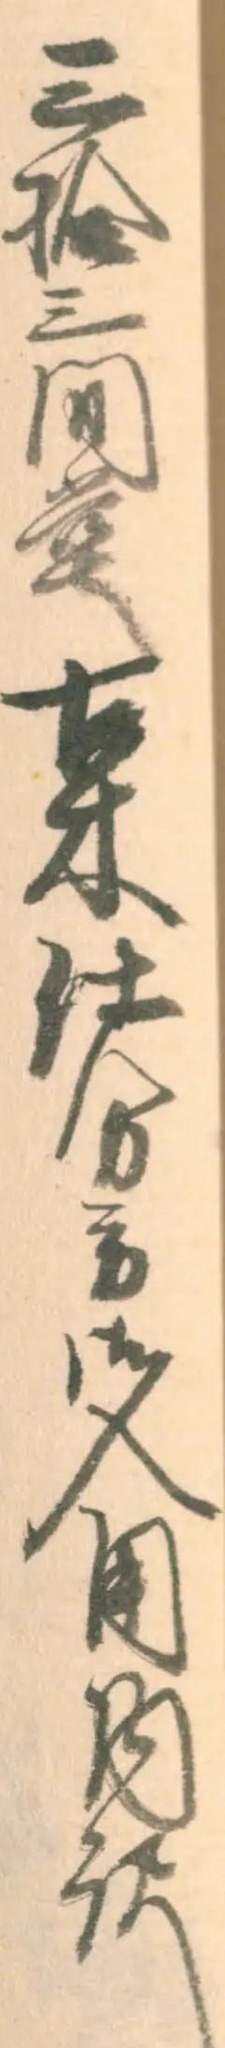三拾三間堂古木仕分方御入用内訳
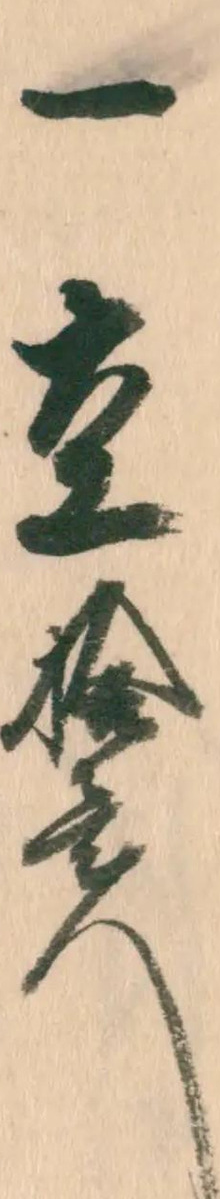一大工拾壱人
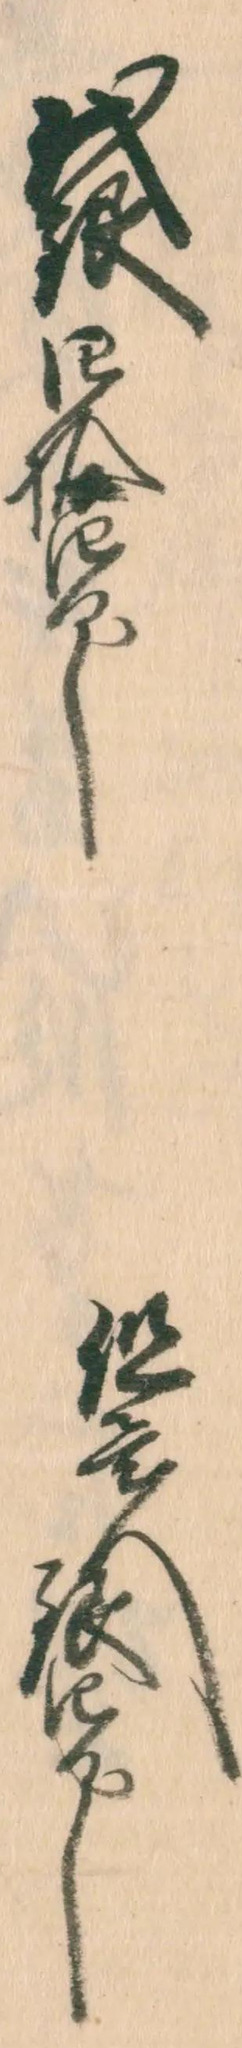代銀四拾四匁但壱人銀四匁
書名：三十三間堂. [1]
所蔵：国立国会図書館 National Diet Library, JAPAN
